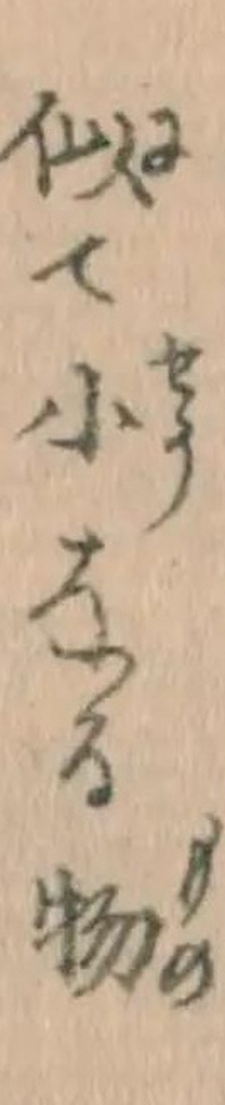似て小なる物

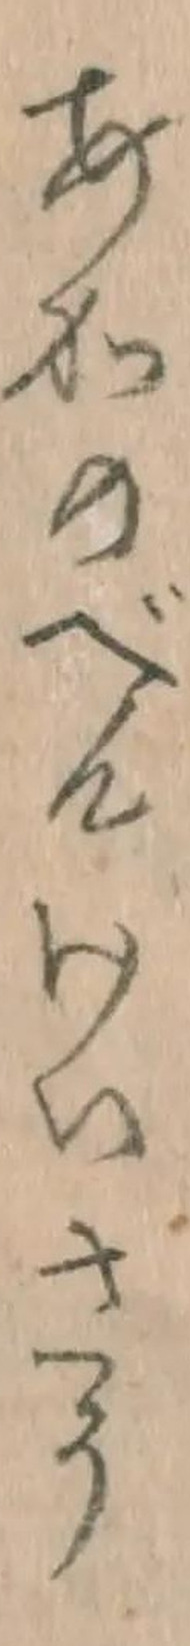あかのべんけいさう
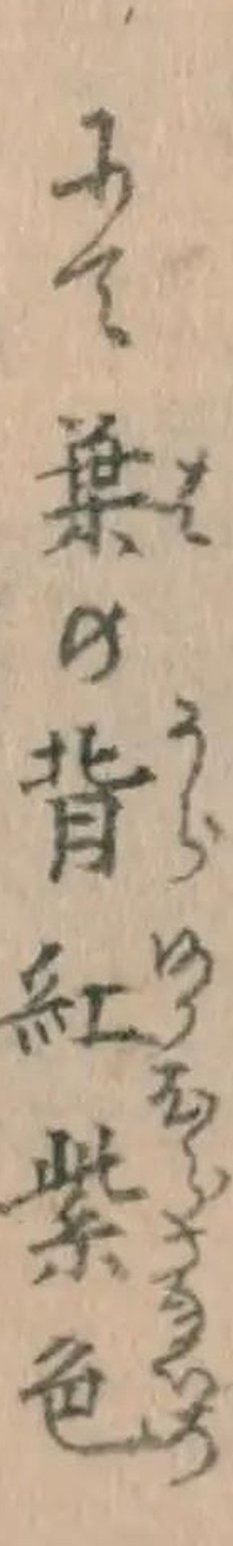にて葉の背紅紫色
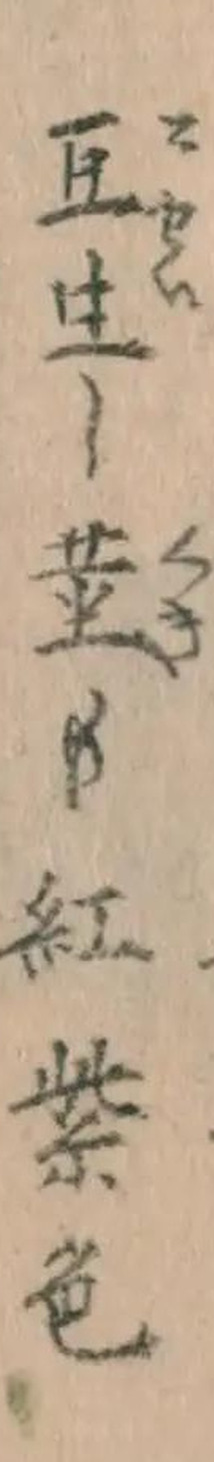互生し茎も紅紫色
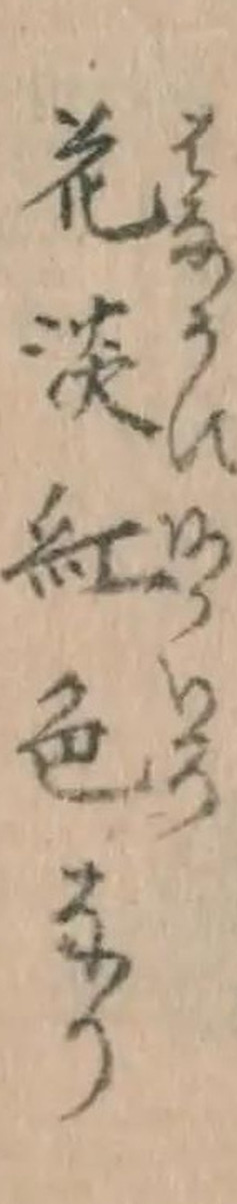花淡紅色なり

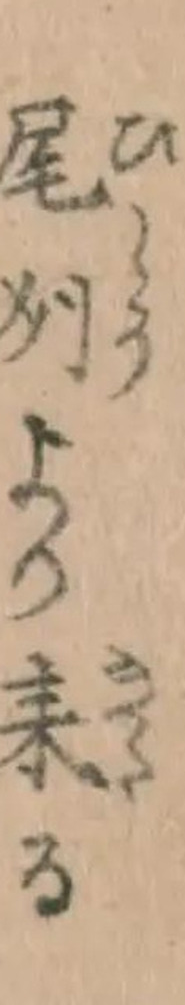尾州より来る
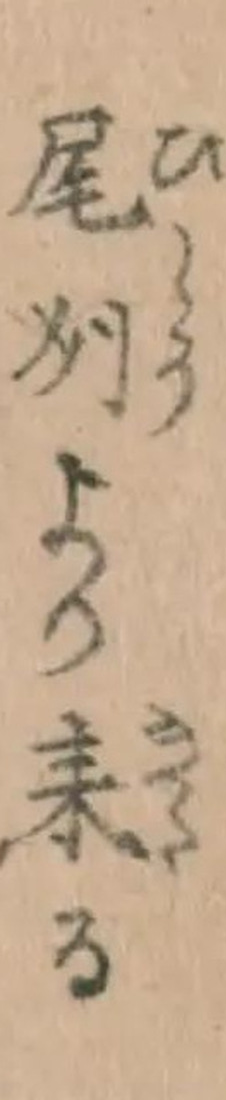尾州より来る
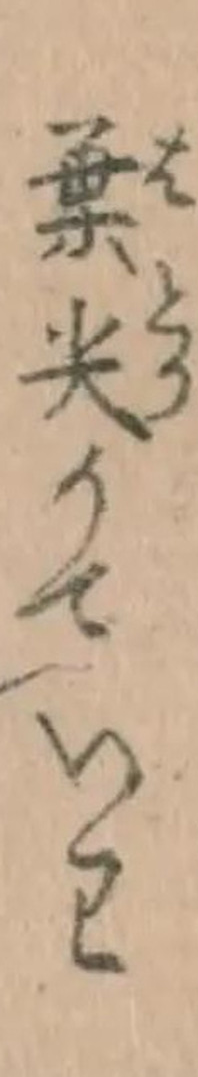葉尖りていわ
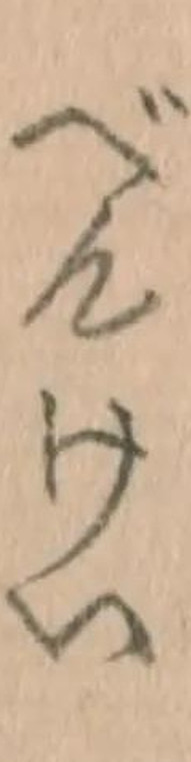べんけい
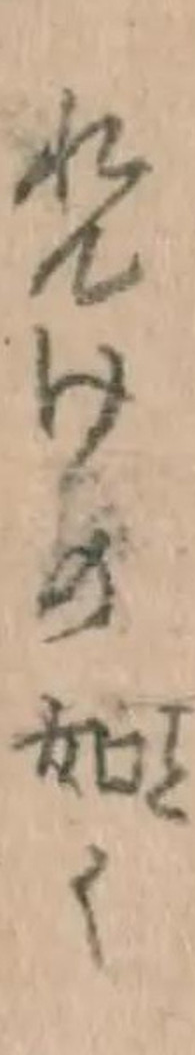れんけの如く
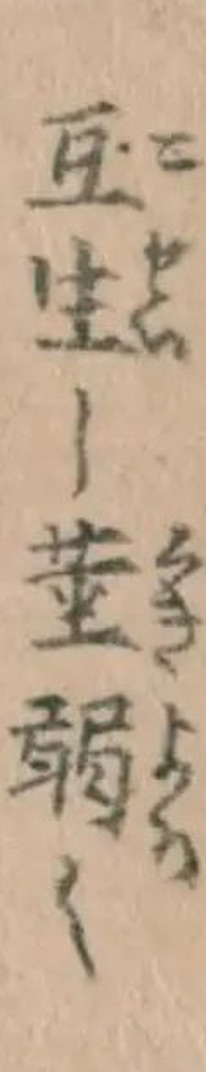互生し茎弱く
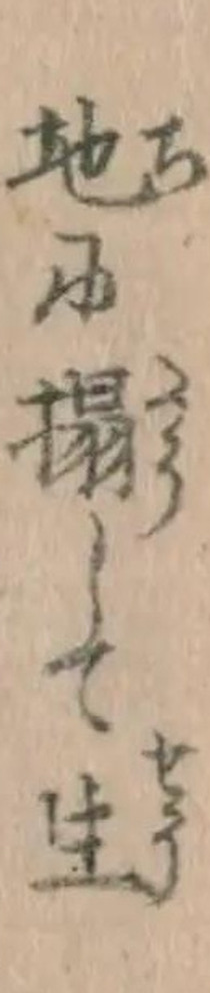地に搨して生
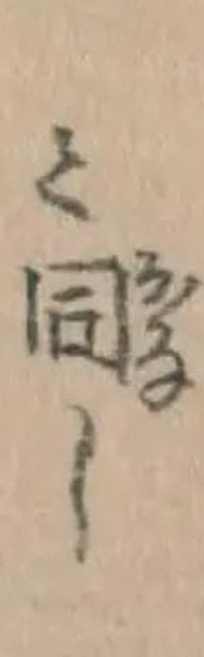と同し
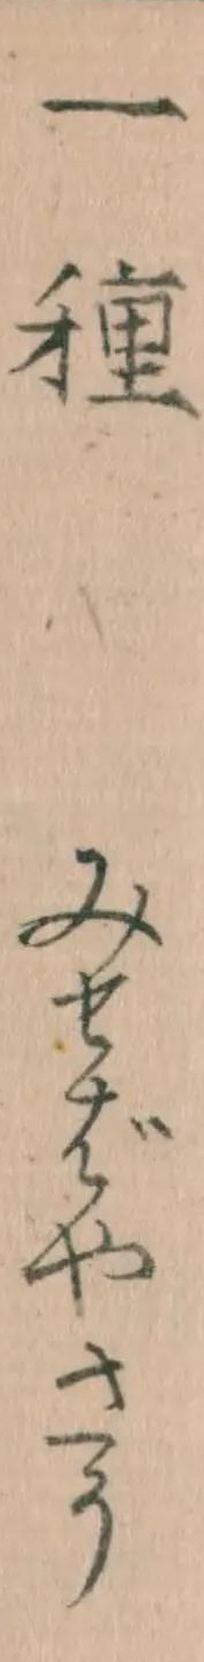一種みせばやさう
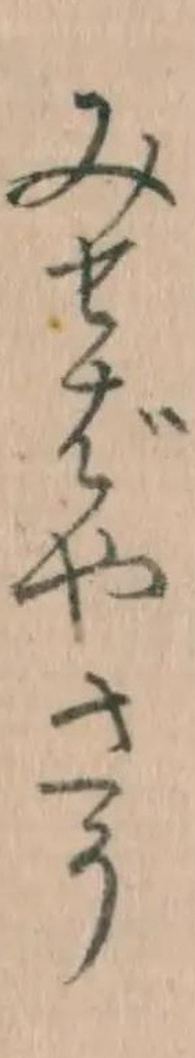みせばやさう
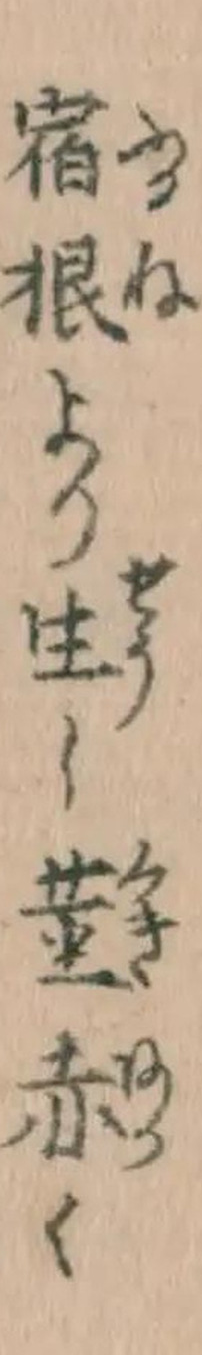宿根より生し茎赤く
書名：本草図譜. 巻34-36
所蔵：国立国会図書館 National Diet Library, JAPAN
